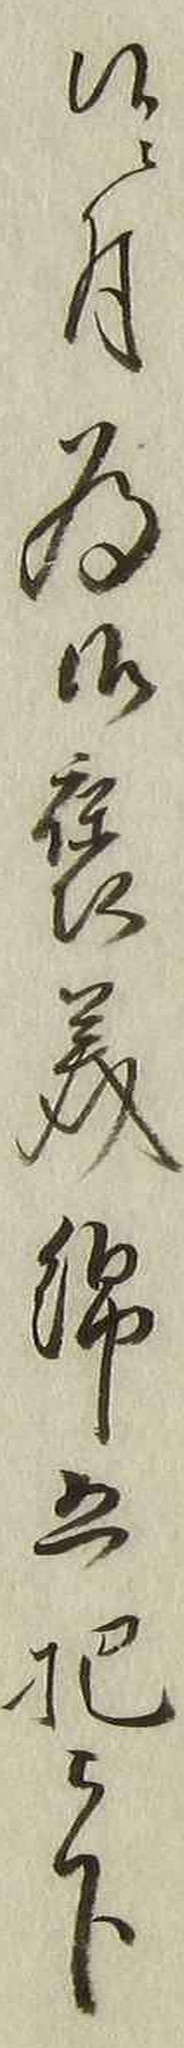候ニ付為御褒美綿五把被下
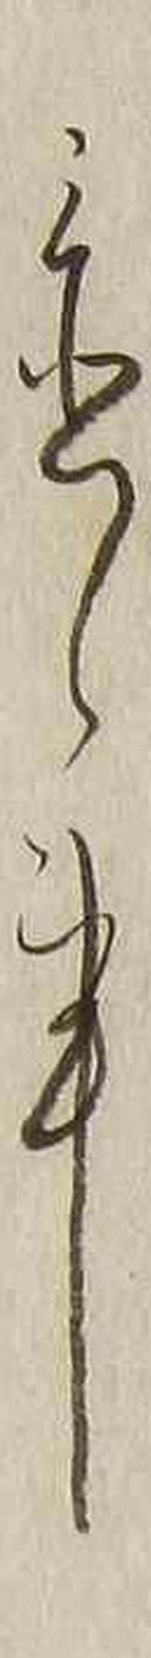置候事
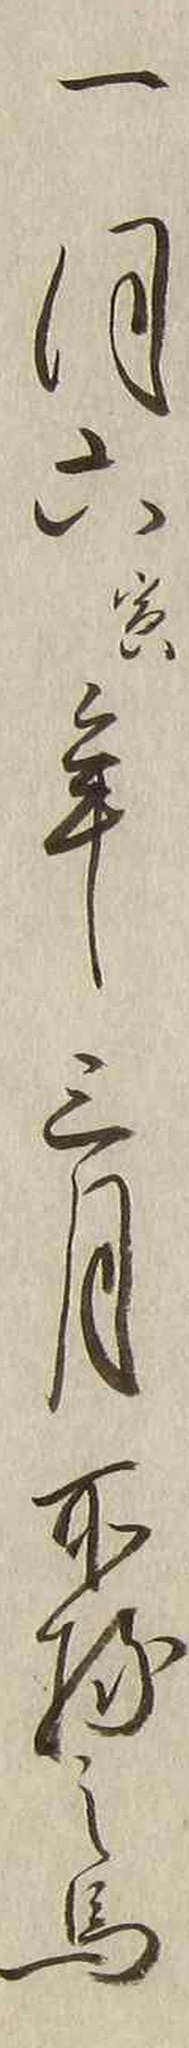一同六寅年三月所持之馬

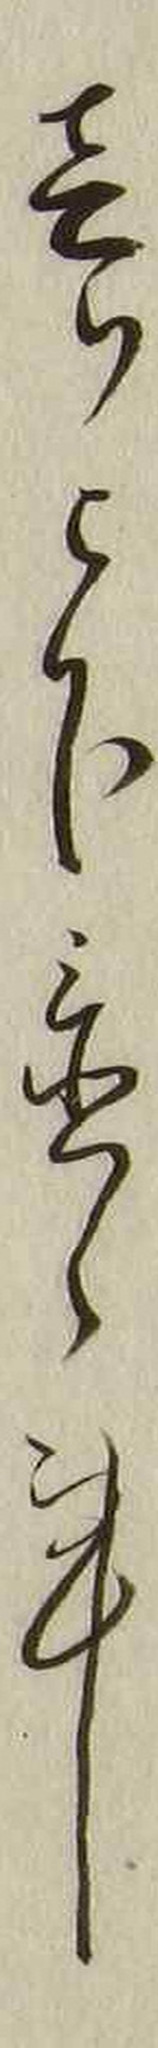壱ツ被下置候事
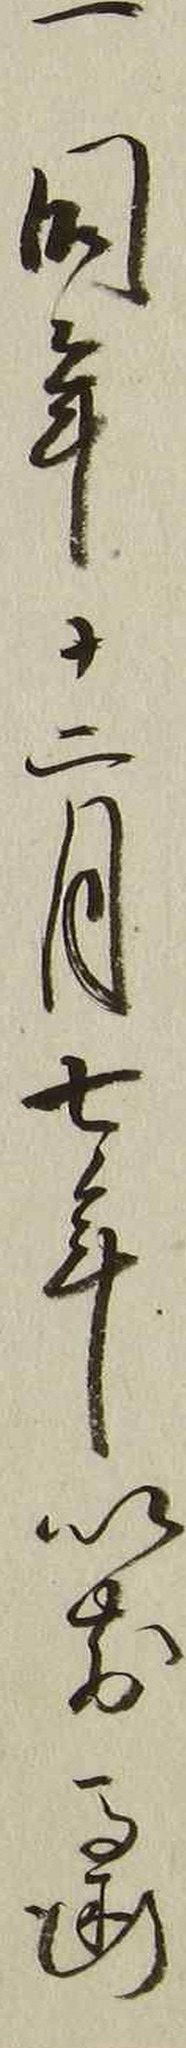一同年十二月七年以前馬術
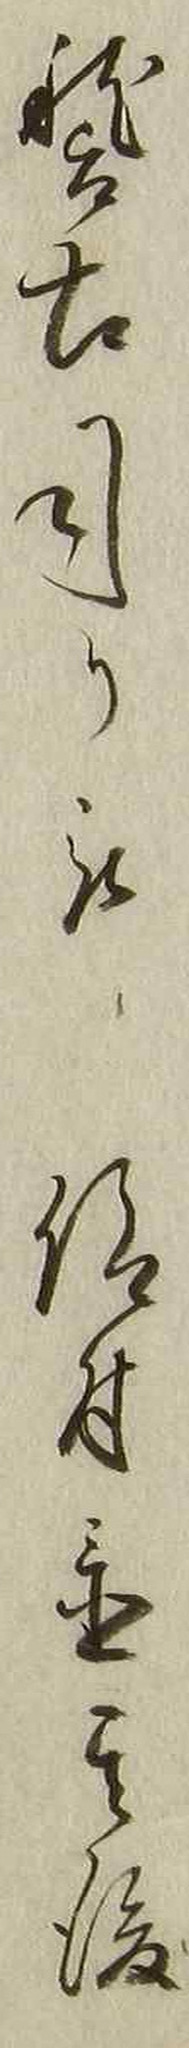稽古司り被仰付置其後
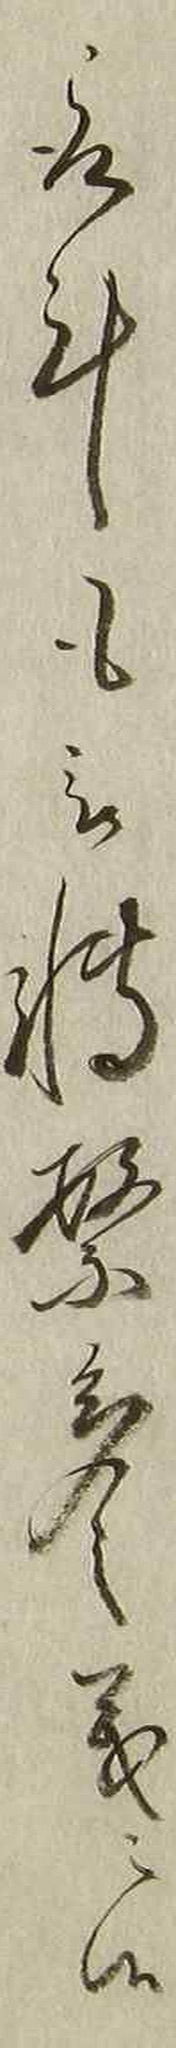取計も被転繁多之義ニ候
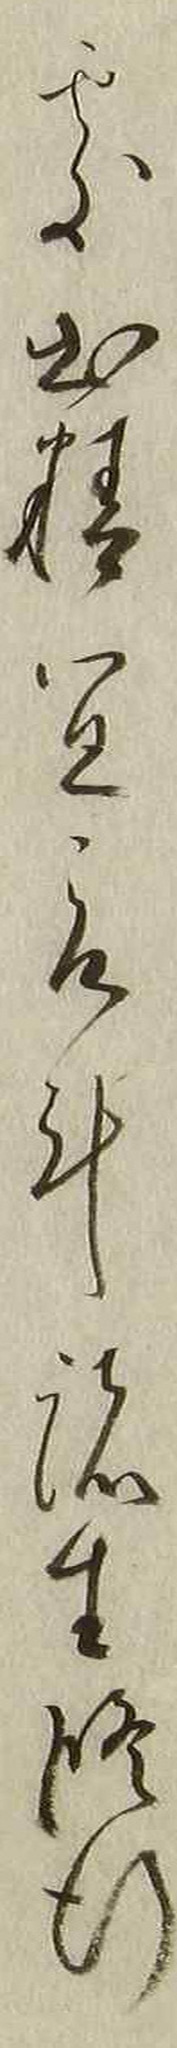処出精宜取計諸生修行
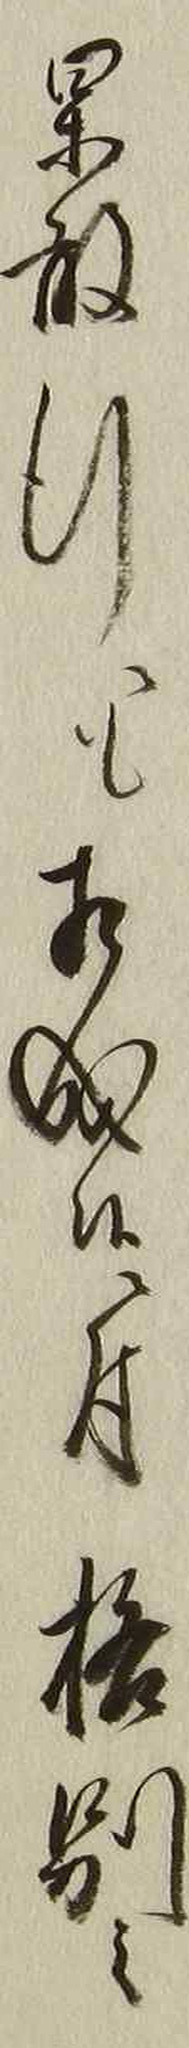果敢行ニも相成候ニ付格別之
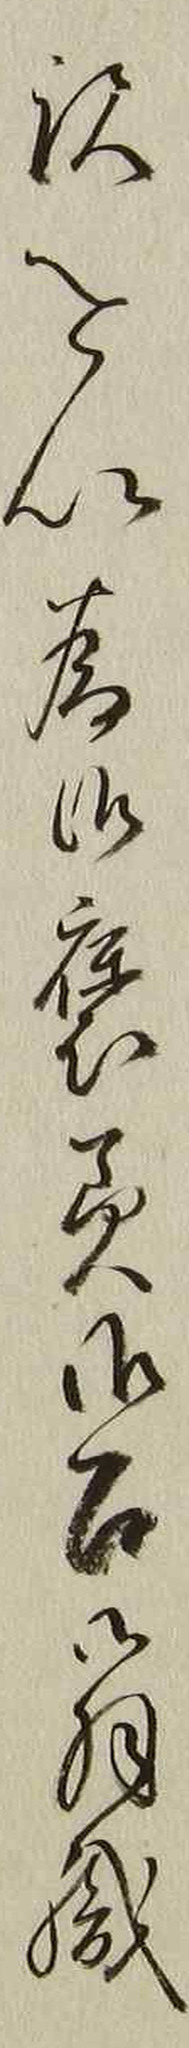訳を以為御褒美御召御羽織
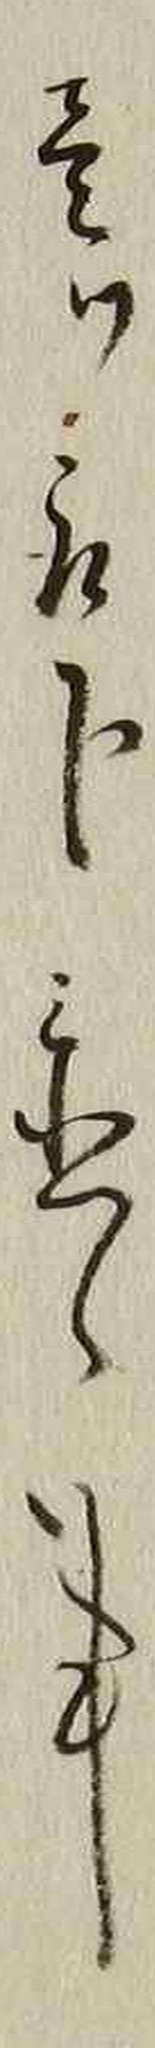壱ツ被下置候事
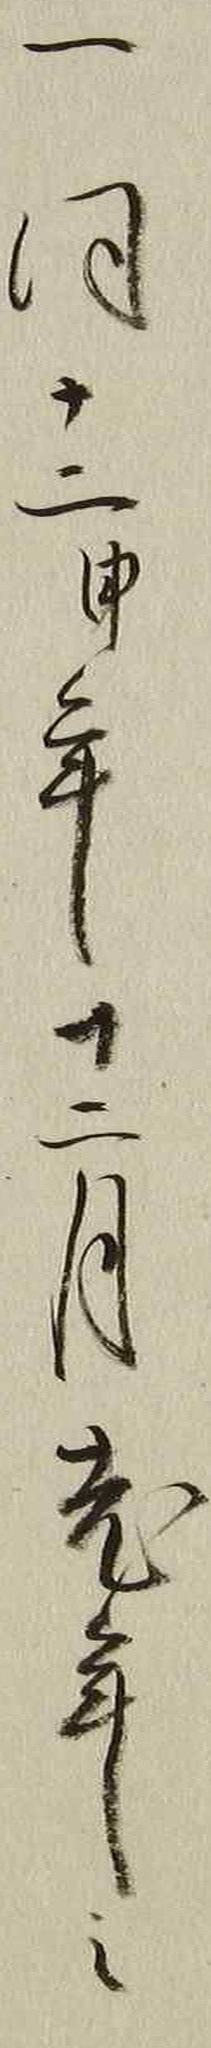一同十二申年十二月老年之
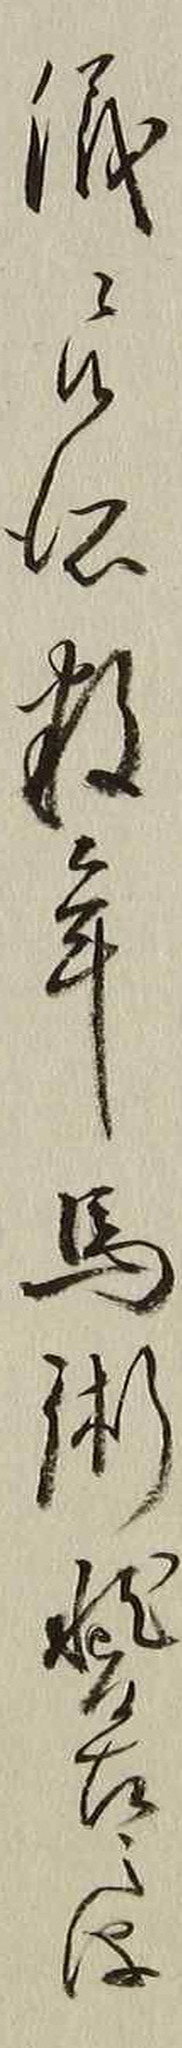儀ニ候所数年馬術稽古之儀
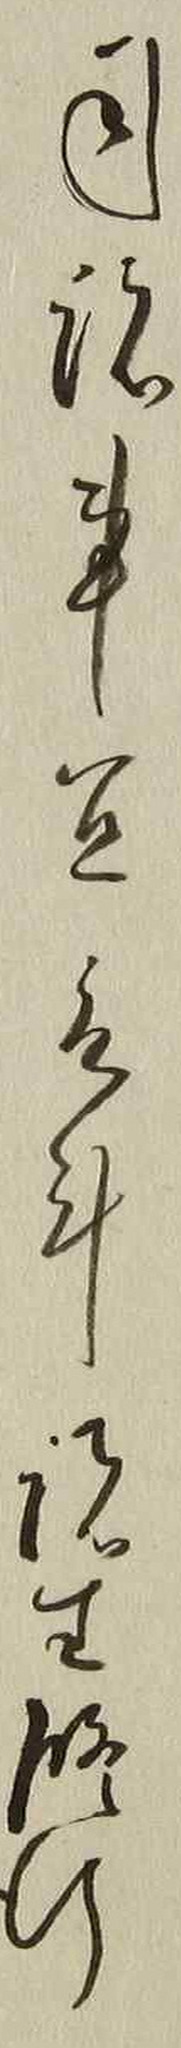司諸事宜取計諸生修行
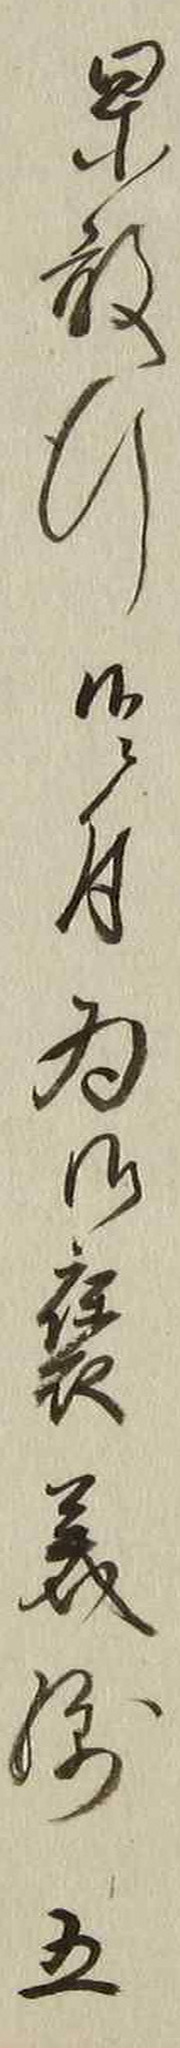果敢行候ニ付為御褒美綿五
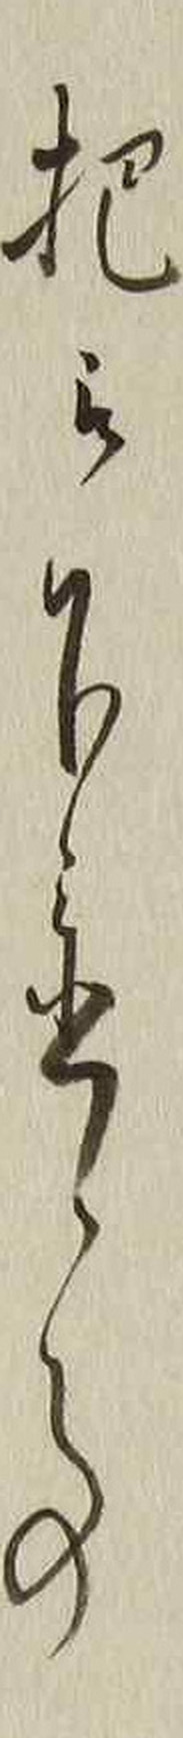把被下置候事
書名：諸士系譜　巻之18　い之部18
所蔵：会津若松市立会津図書館
